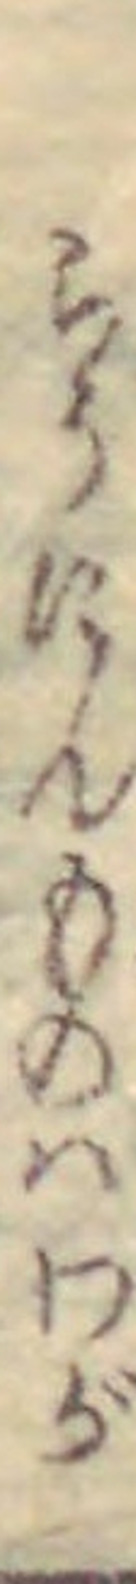らうにんものはわが
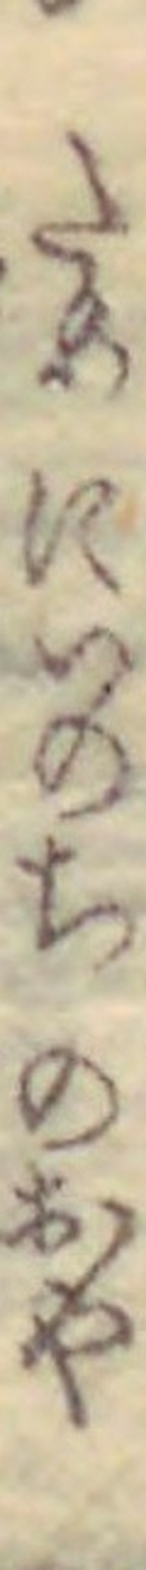ためにいのちのおや
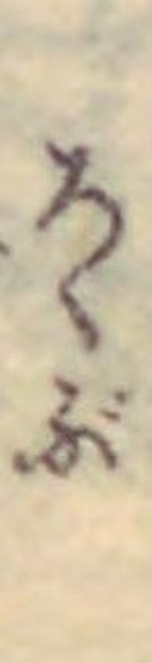ろくぶ
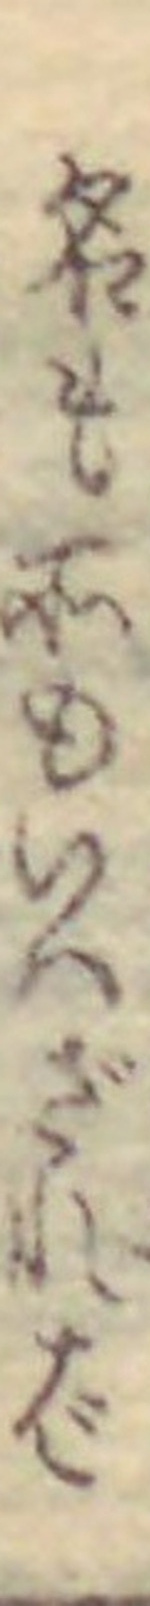名も所もいはざれば
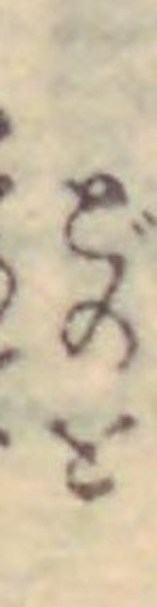どのを
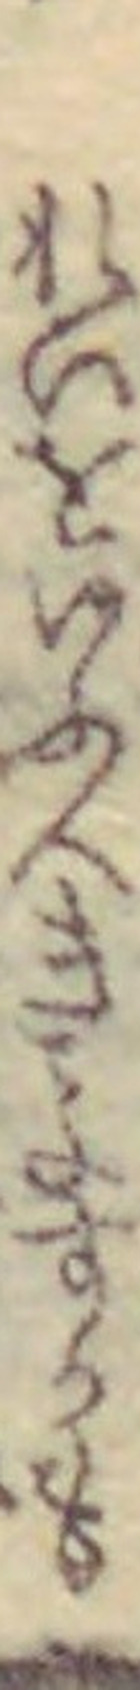れいをいふへきよすかも
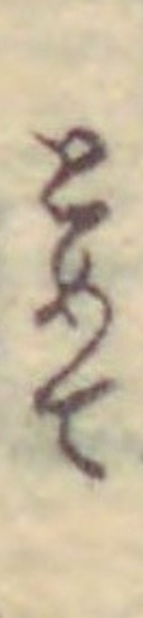とめて
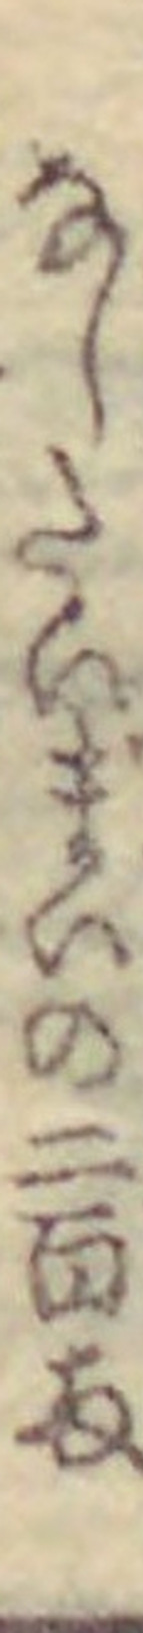なしたいまいの二百両
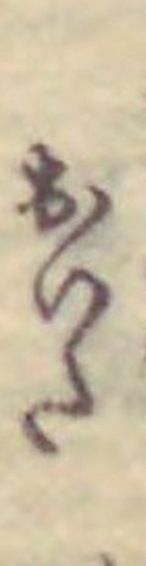おいた
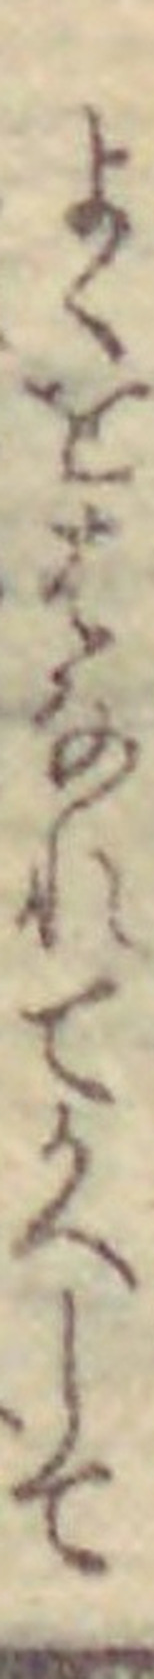よくをはなれてかへして
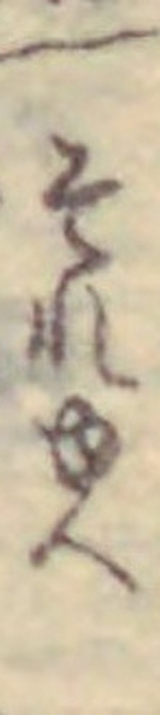それゆへ
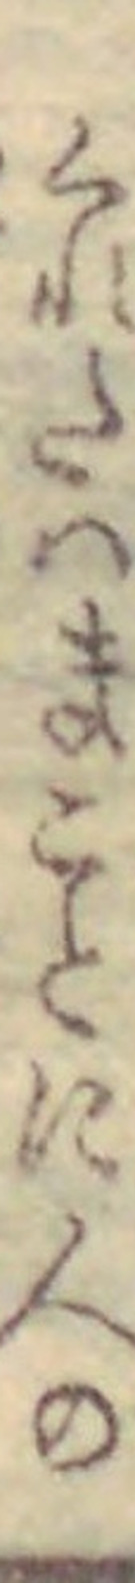くれたはまことに人の
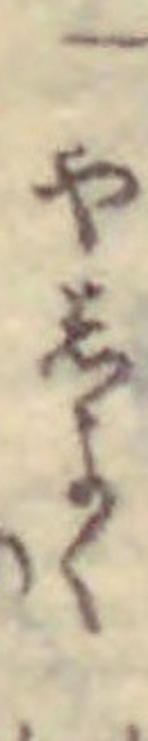やしよく
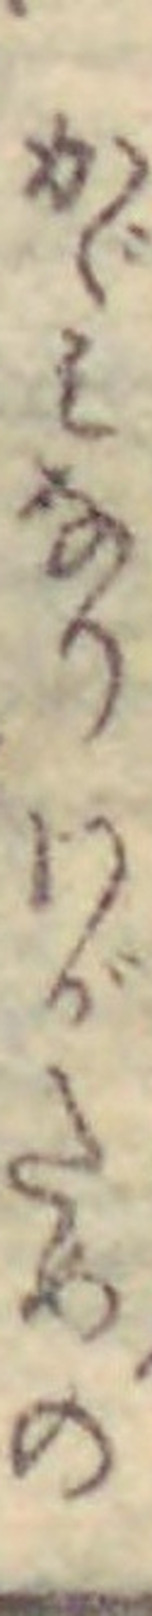かゞみなりわがための
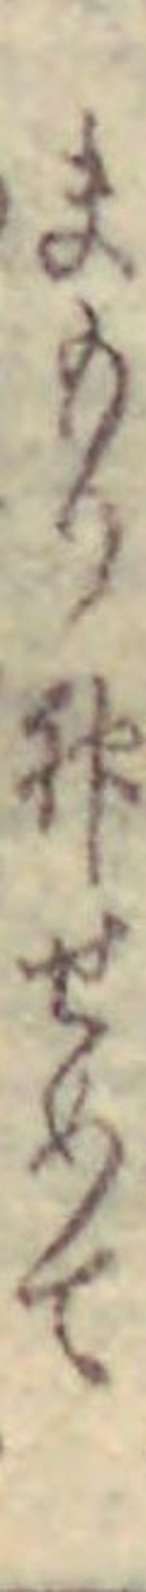まもり神せめて
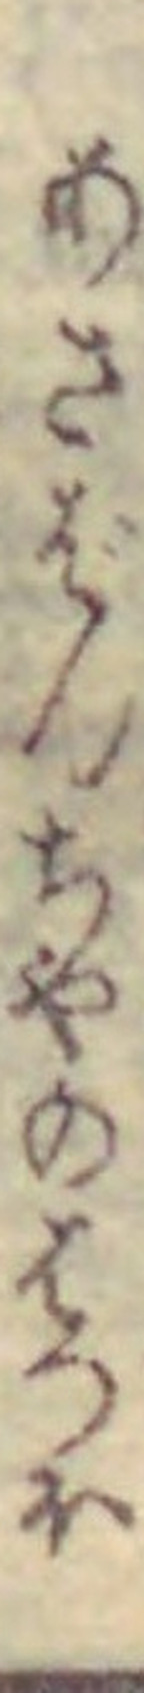あさばんちやのはつほ
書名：八ツ目鱣因縁物語 3巻
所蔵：国立国会図書館 National Diet Library, JAPAN
